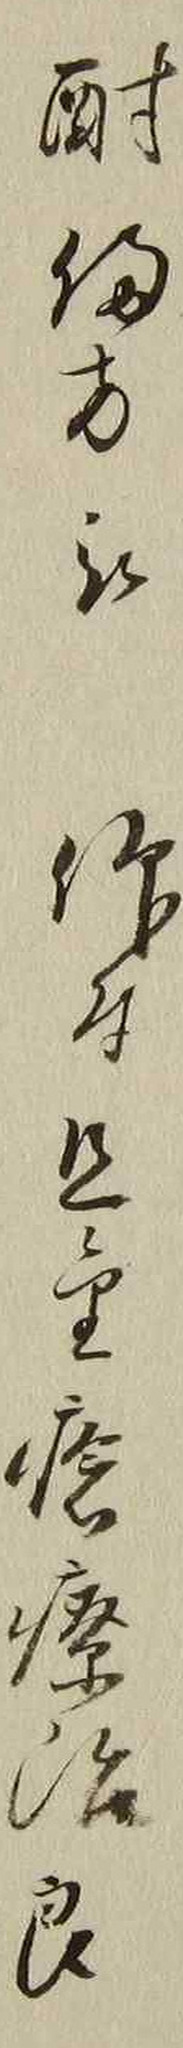酎備方被仰付且金瘡療治良
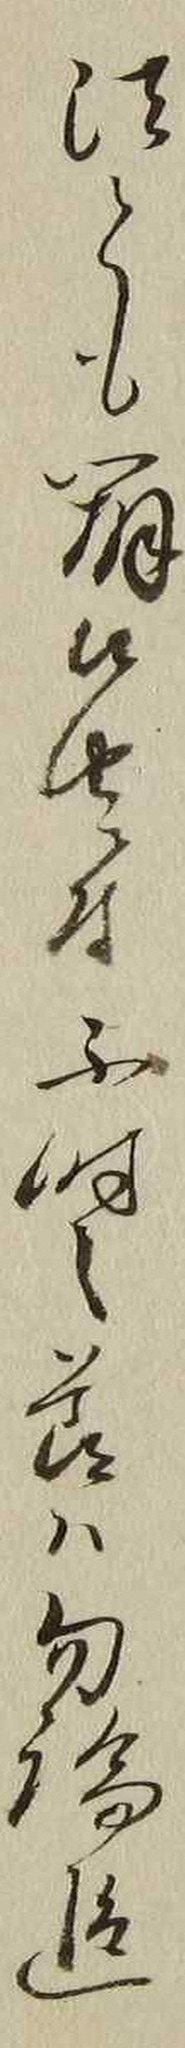法とも弁候由ニ付不時之節ハ勿論追
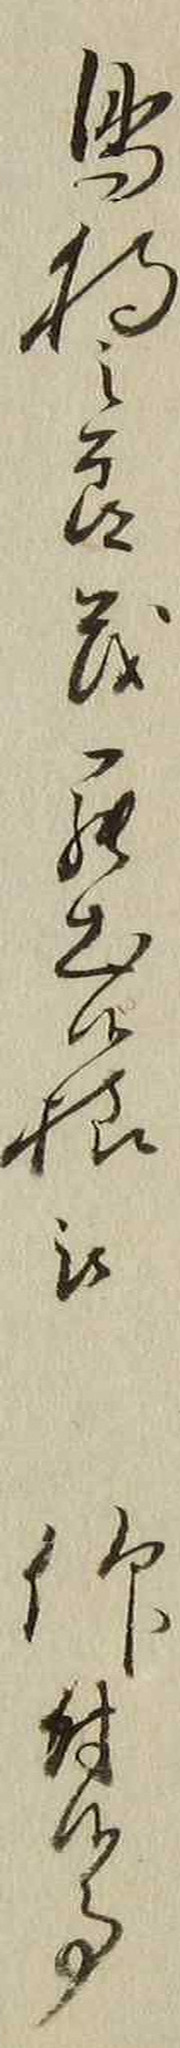鳥狩之節も罷出候様被仰付候事
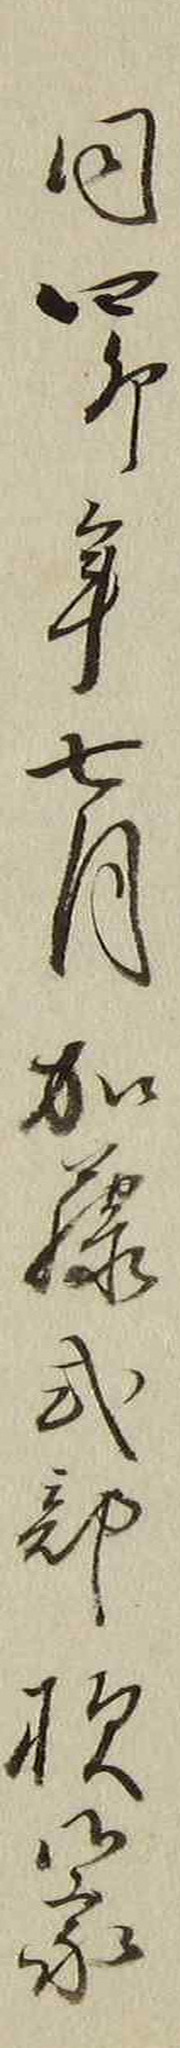一同四卯年七月加藤式部様御家
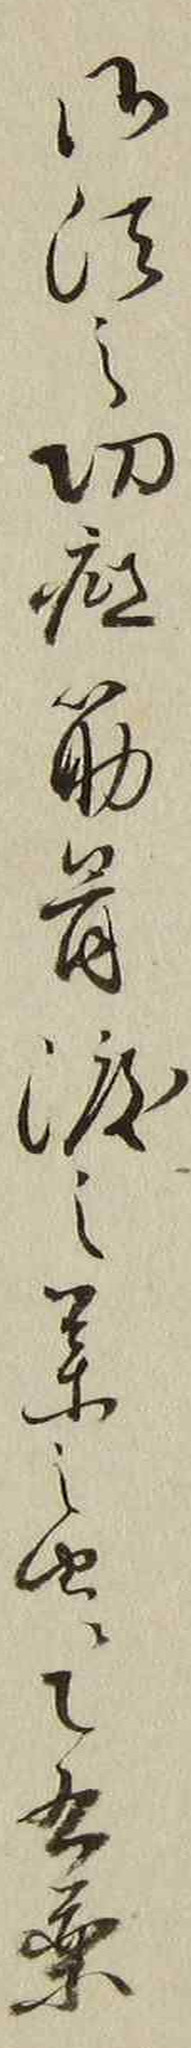御法之切疵筋骨渡之薬之由ニて右薬
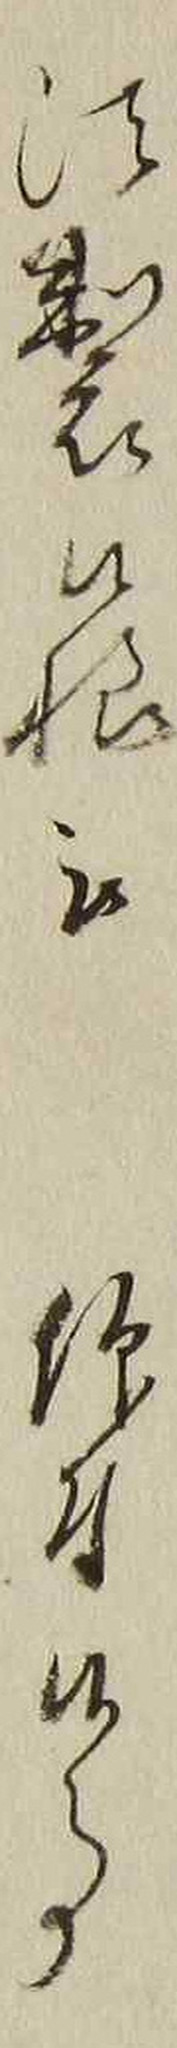法製候様被仰付候事
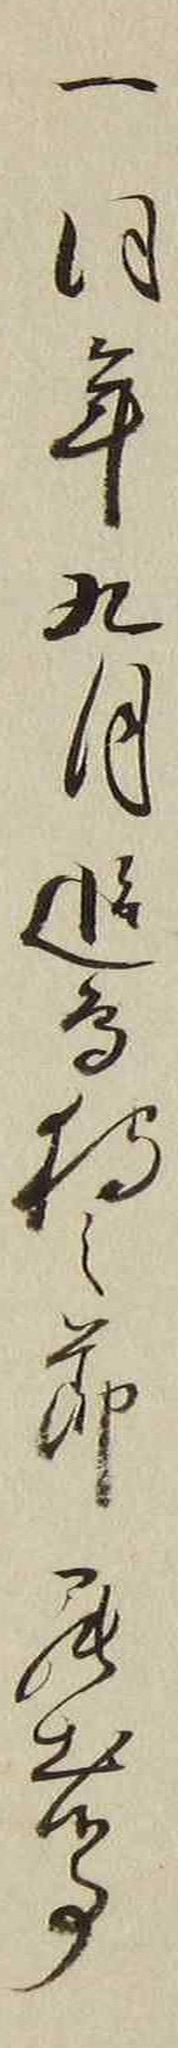一同年九月追鳥狩之節罷出候事
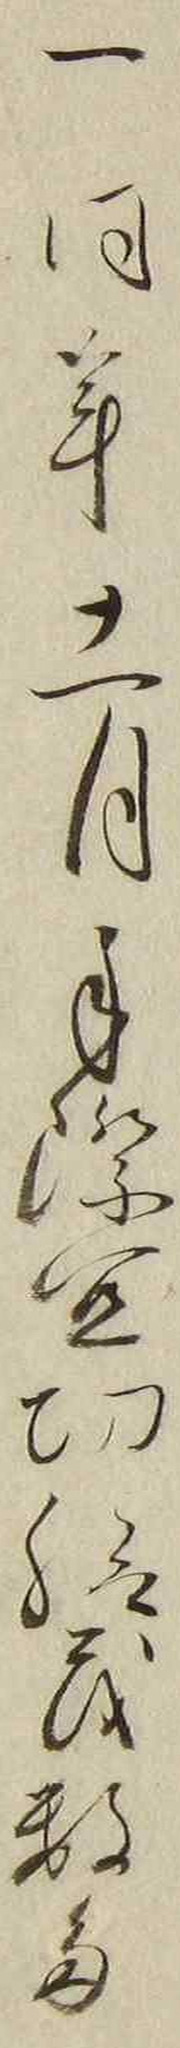一同年十一月手際宜切給も数多
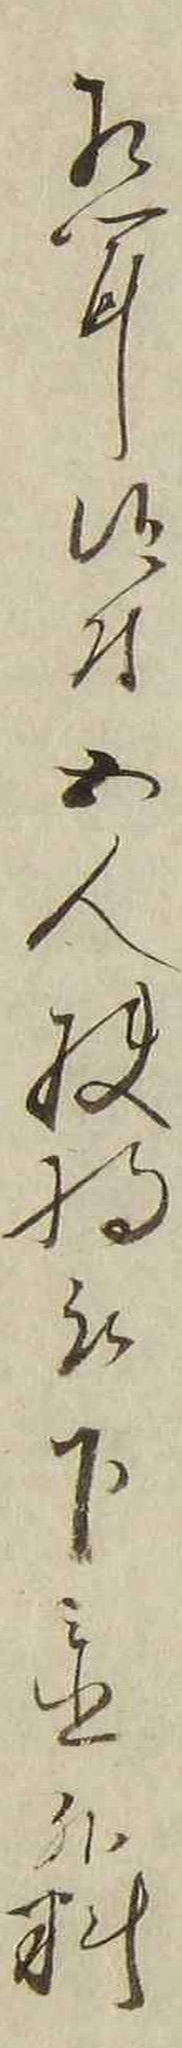相聞候ニ付五人扶持被下置外料

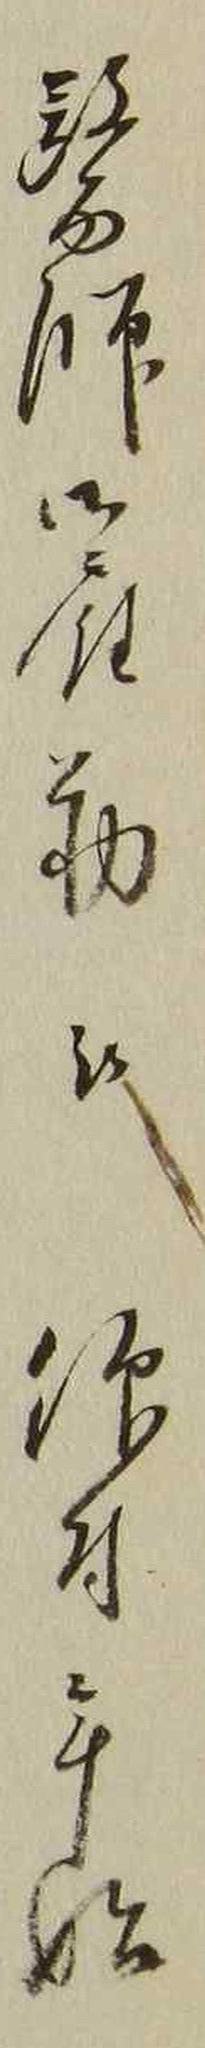医師御雇勤被仰付年始
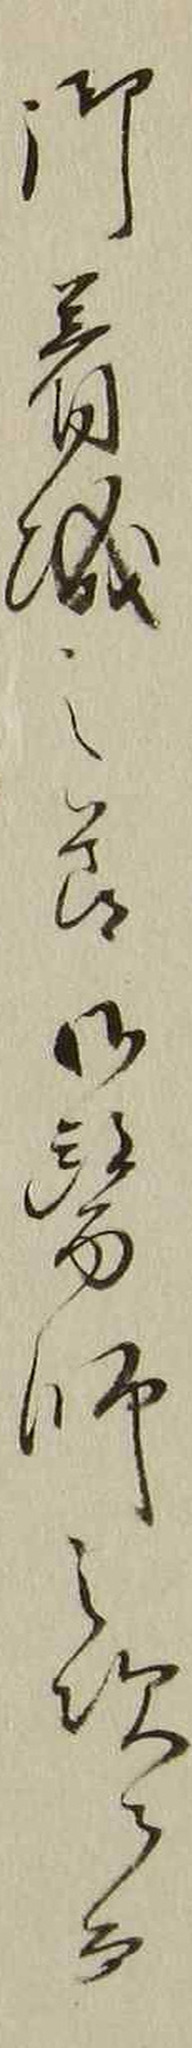御着城之節御医師之次ニ而
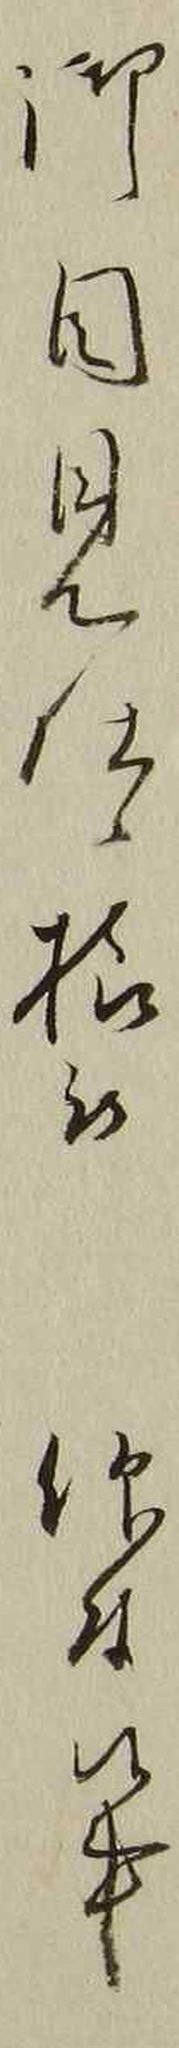御目見仕候様被仰付候事
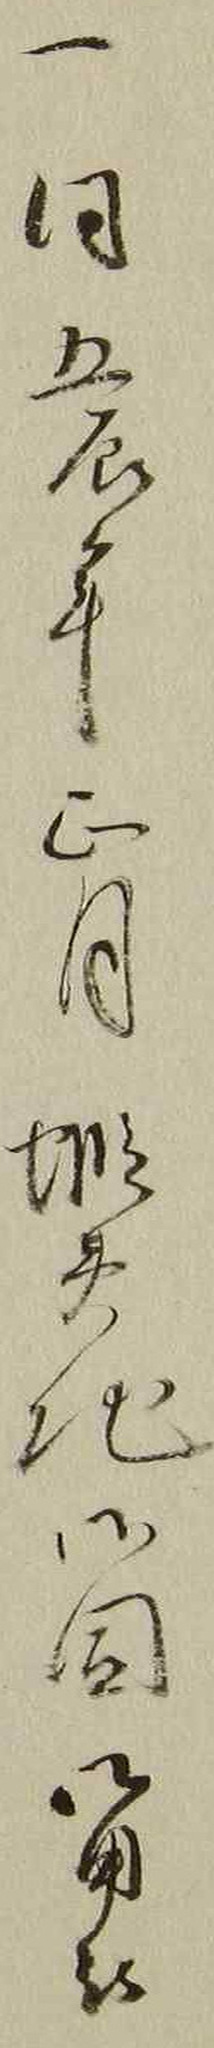一同五辰年正月蝦夷地御固御用被
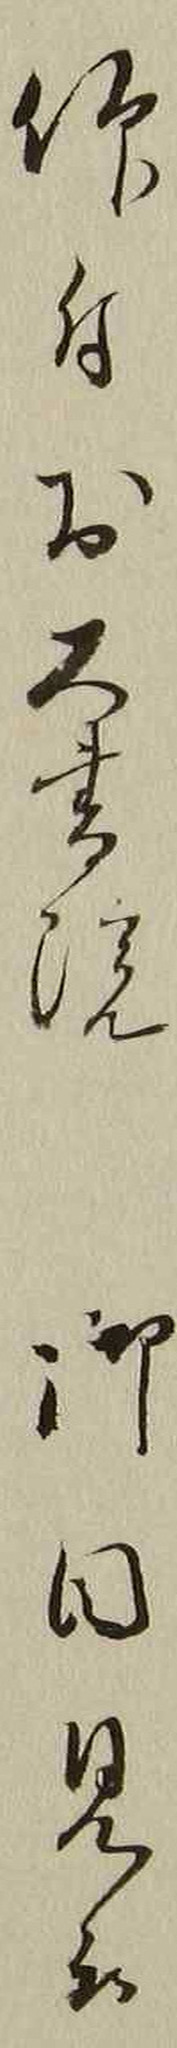仰付於大寿院御目見被
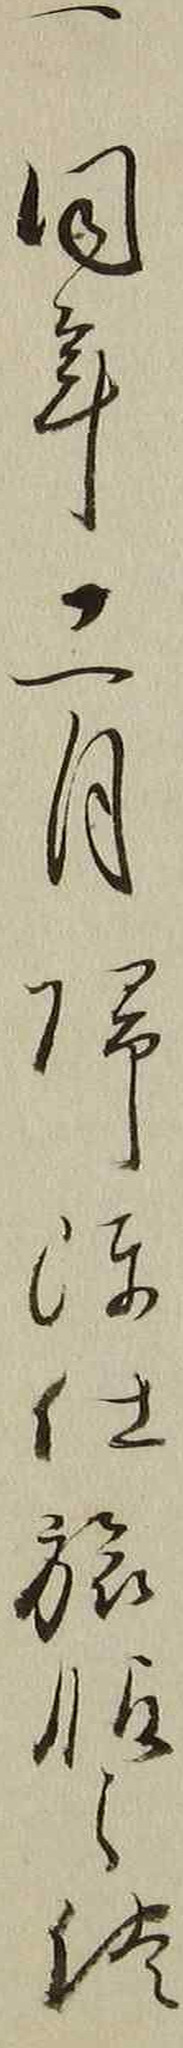一同年十一月帰陣仕旅服之侭
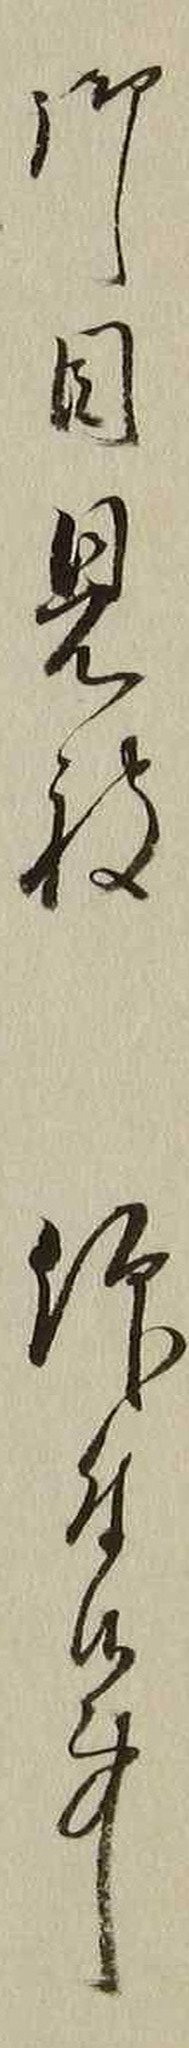御目見被仰付候事
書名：諸士系譜　巻之129　た之部5
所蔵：会津若松市立会津図書館
